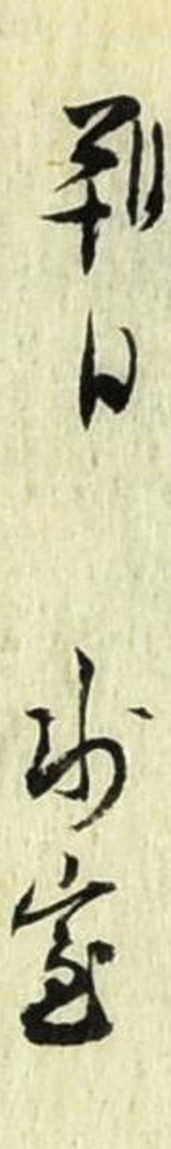朔日氷室
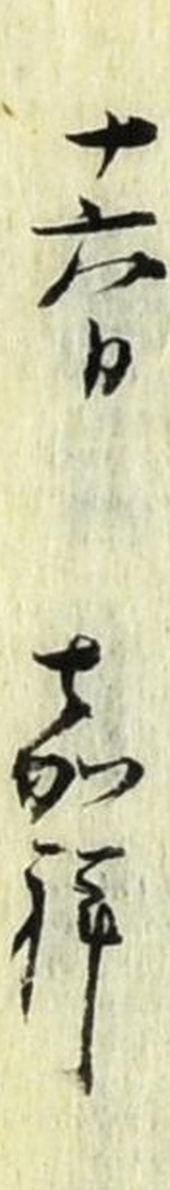十六日嘉祥
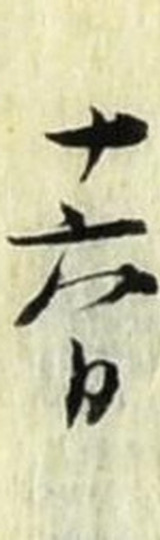十九日
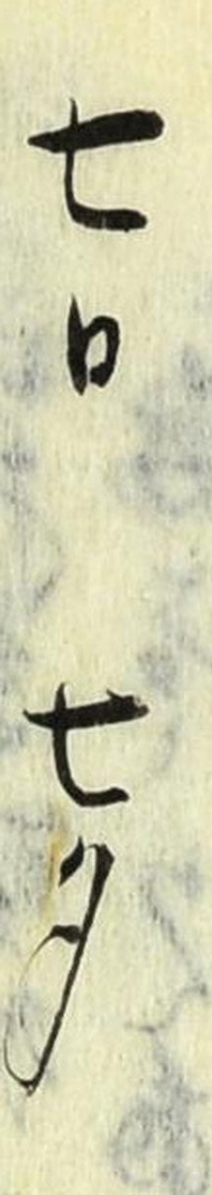七日七夕
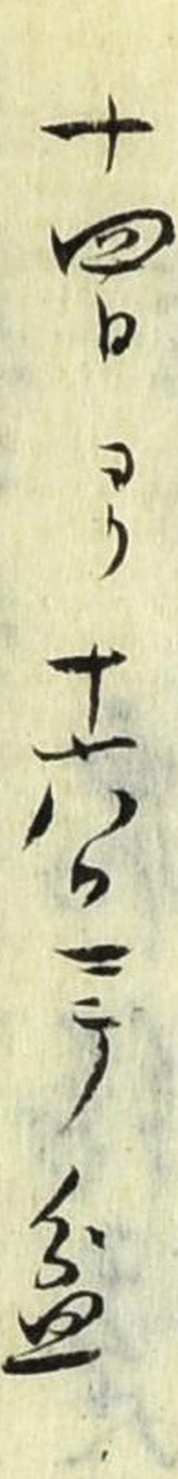十四日より十六日まて盆
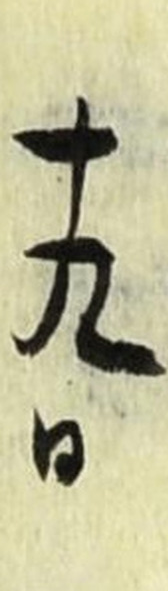十九日
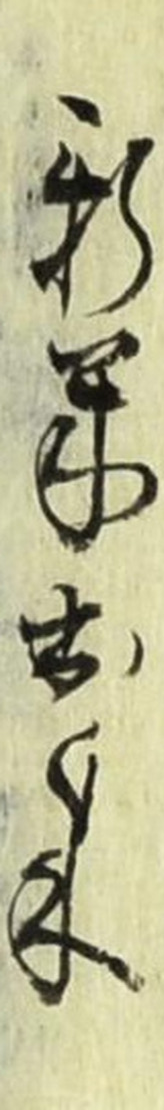新米出来

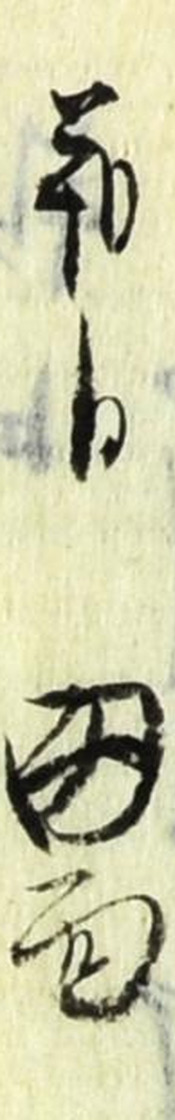朔日田面
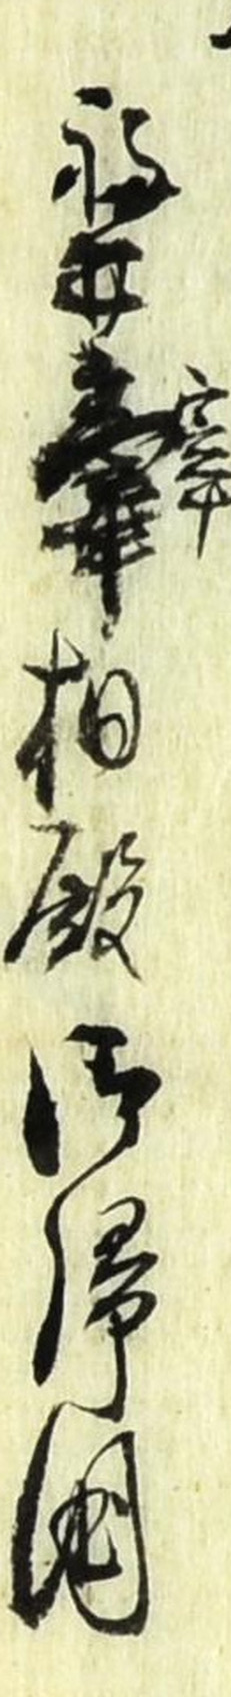福井宰相殿御帰国
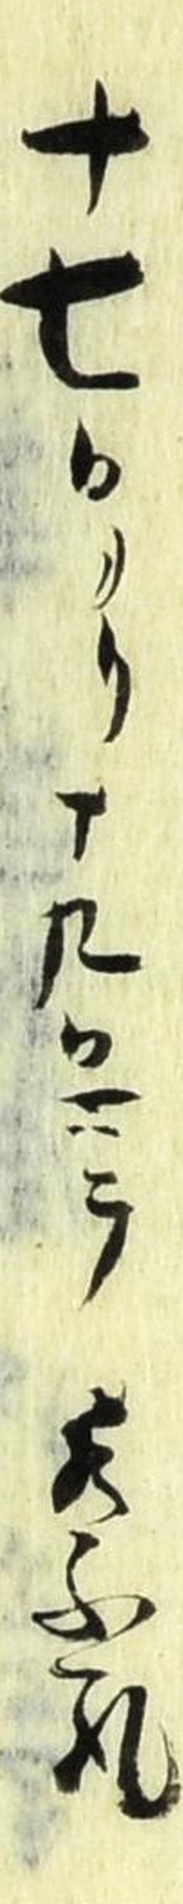十七日より十九日まて祭礼
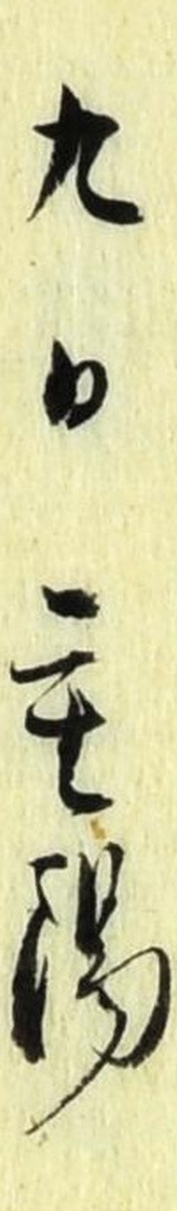九日重陽
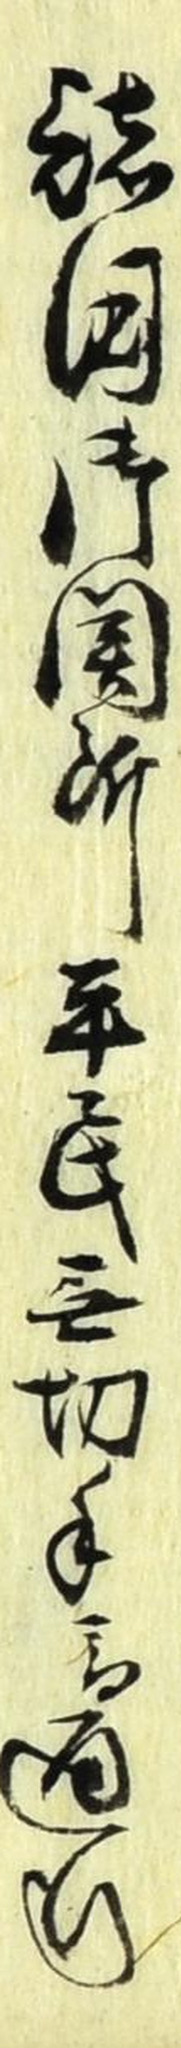諸国御関所平民無切手に而通行
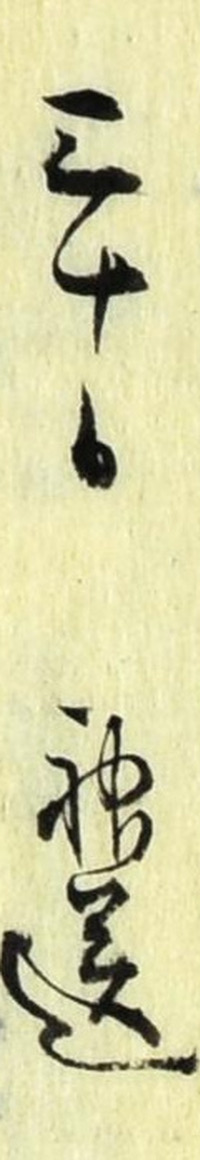三十日神送

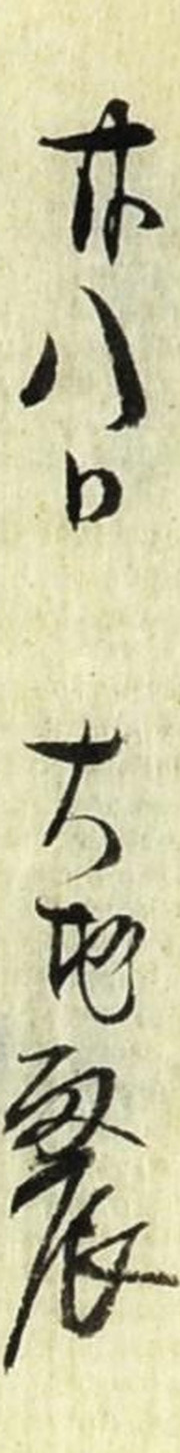廿八日大地震
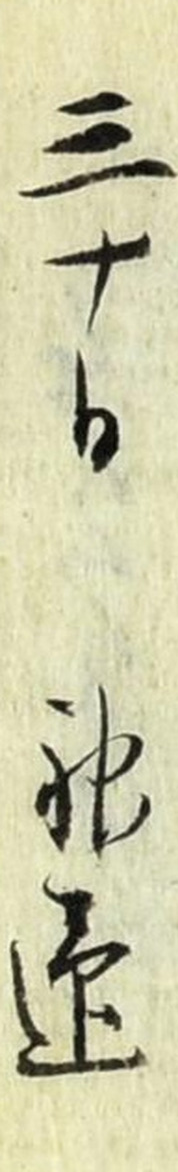三十日神迎
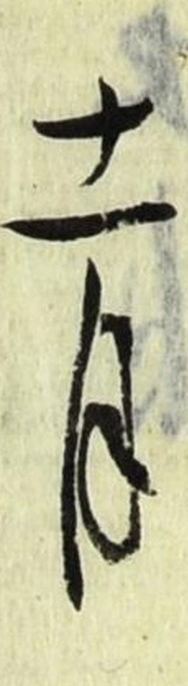十一月
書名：（日記）
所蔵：福井県文書館 Fukui Prefectural Archives
